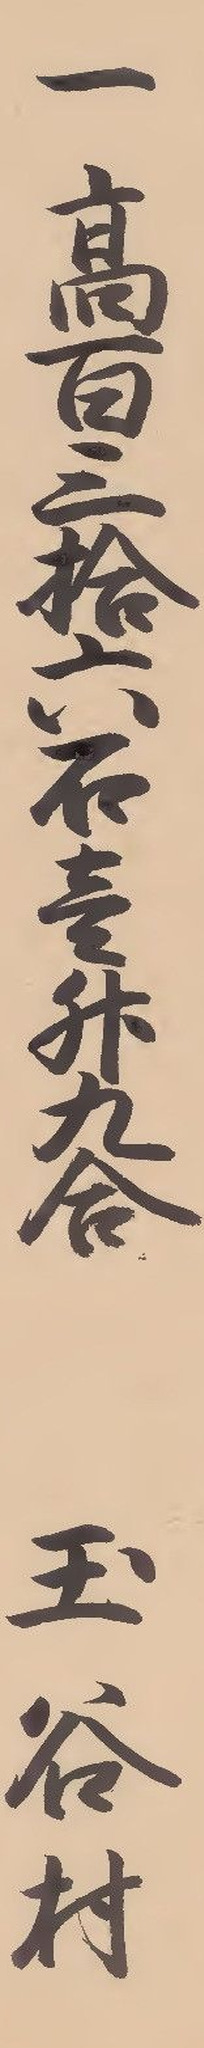一高百三拾六石壱升九合玉谷村
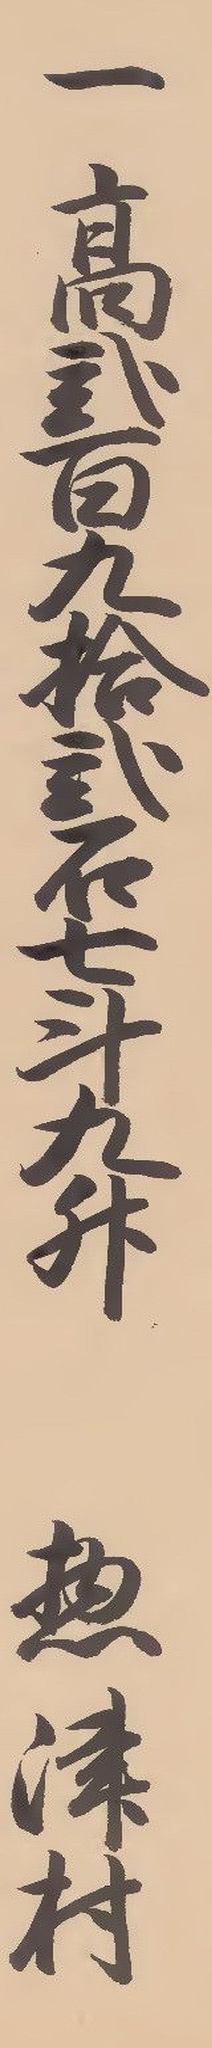一高弐百九拾弐石七斗九升惣津村
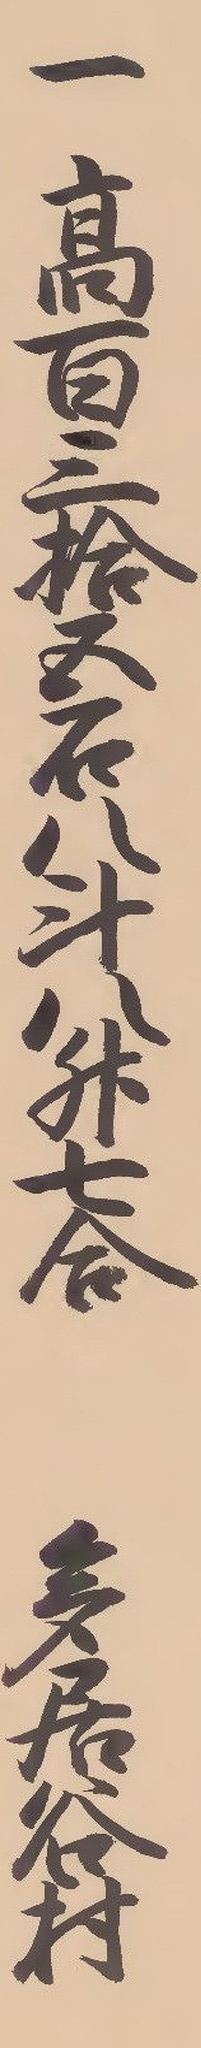一高百三拾五石八斗八升七合多居谷村

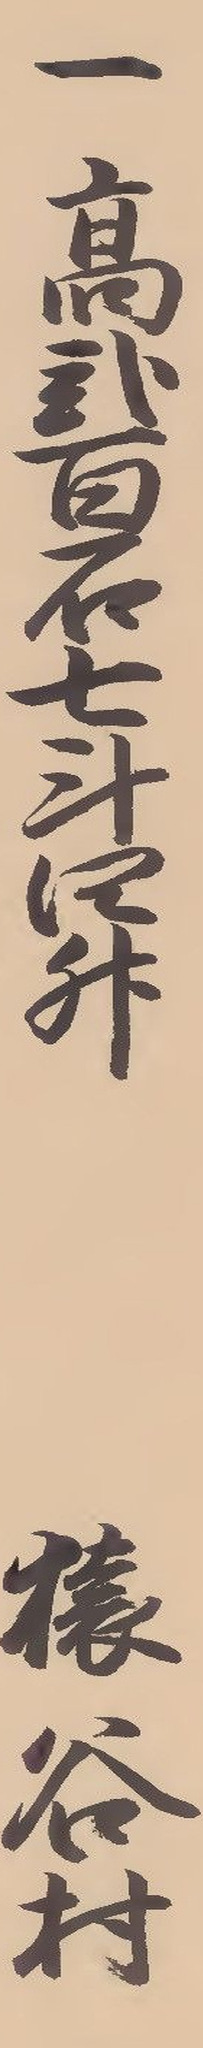一高弐百石七斗四升猿谷村
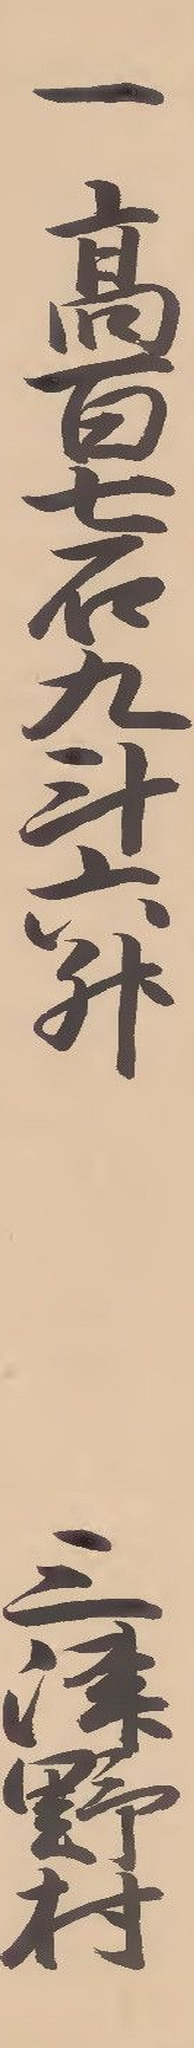一高百七石九斗六升三津野村
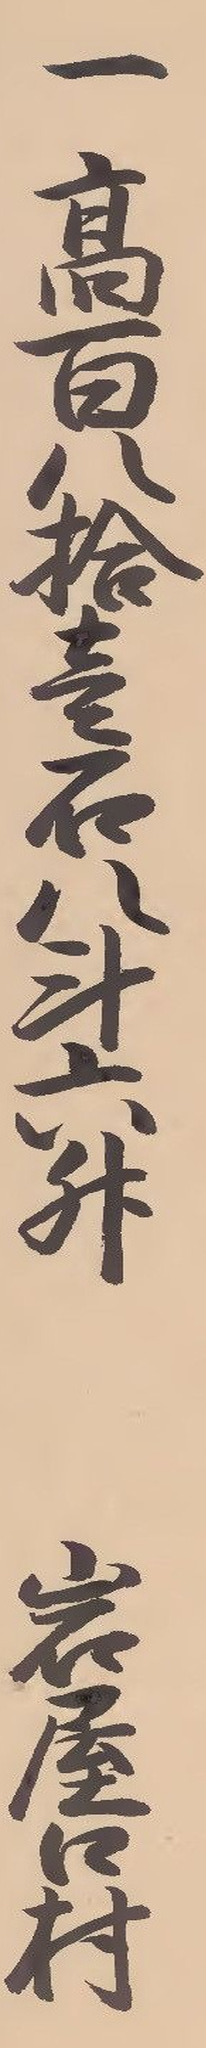一高百八拾壱石八斗六升岩屋口村
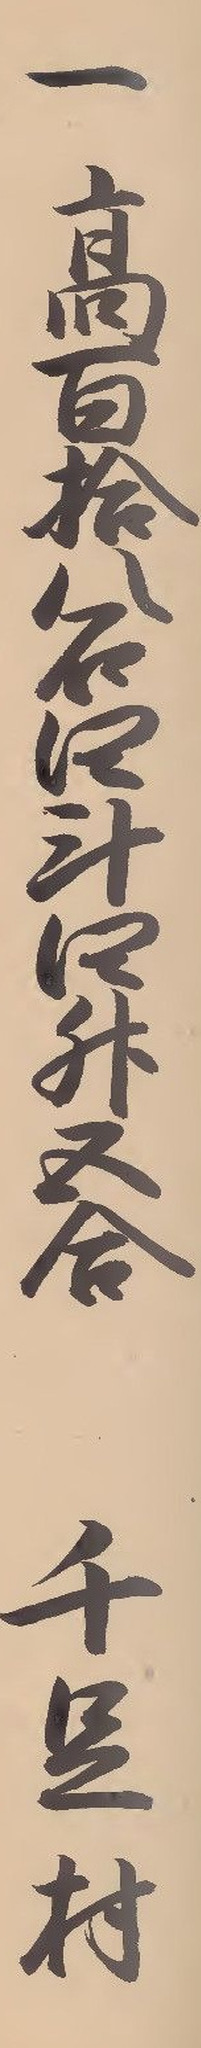一高百拾八石四斗四升五合千足村
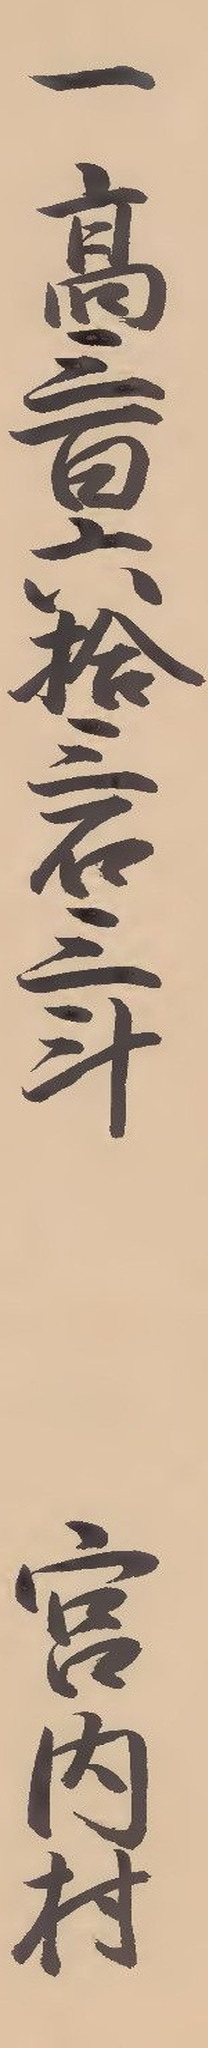一高三百六拾三石三斗宮内村
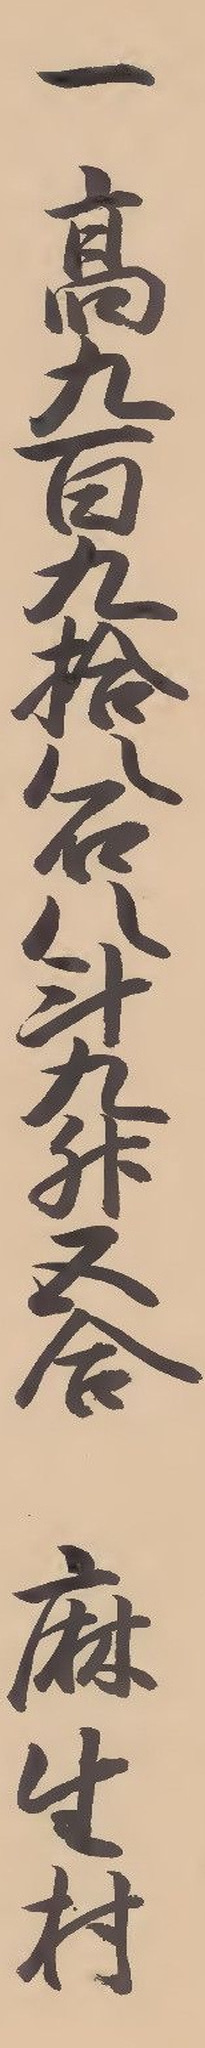一高九百九拾八石八斗九升五合麻生村
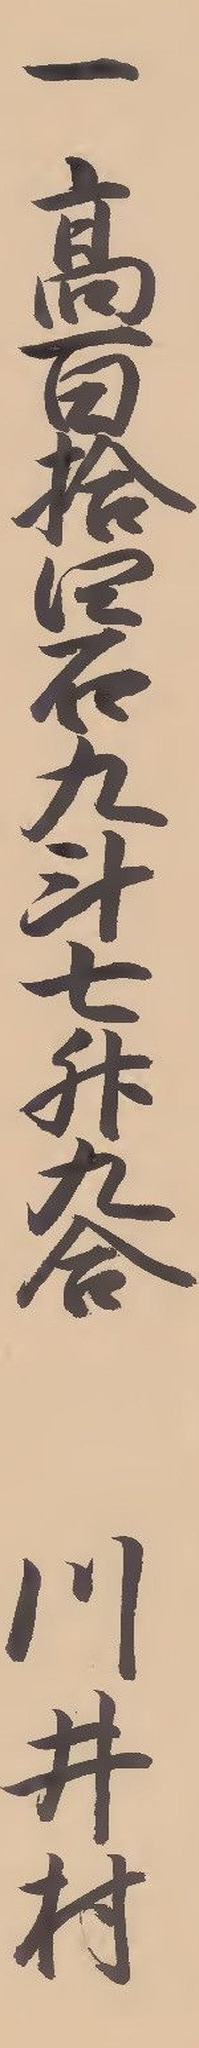一高百拾四石九斗七升九合川井村

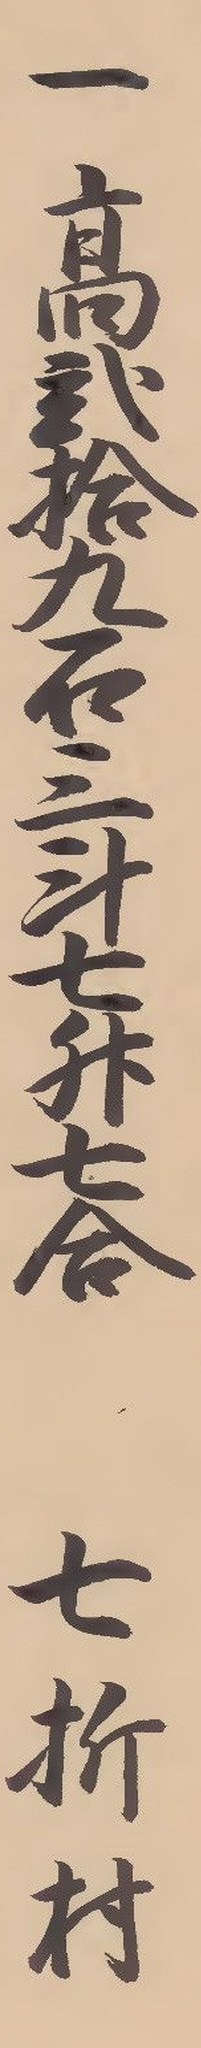一高弐拾九石三斗七升七合七折村
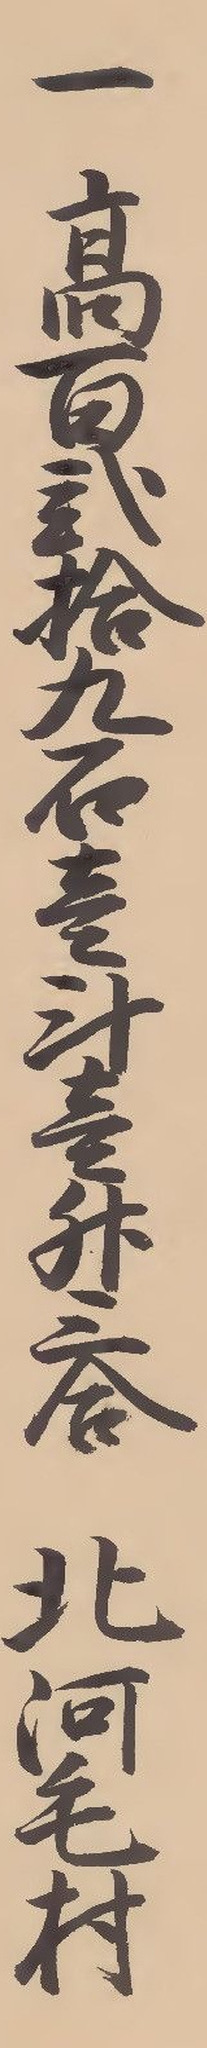一高百弐拾九石壱斗壱升三合北河毛村
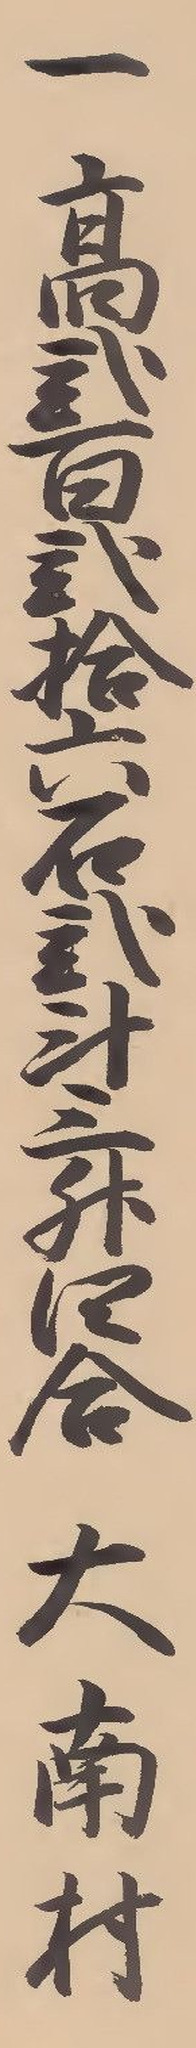一高弐百弐拾六石弐斗三升四合大南村
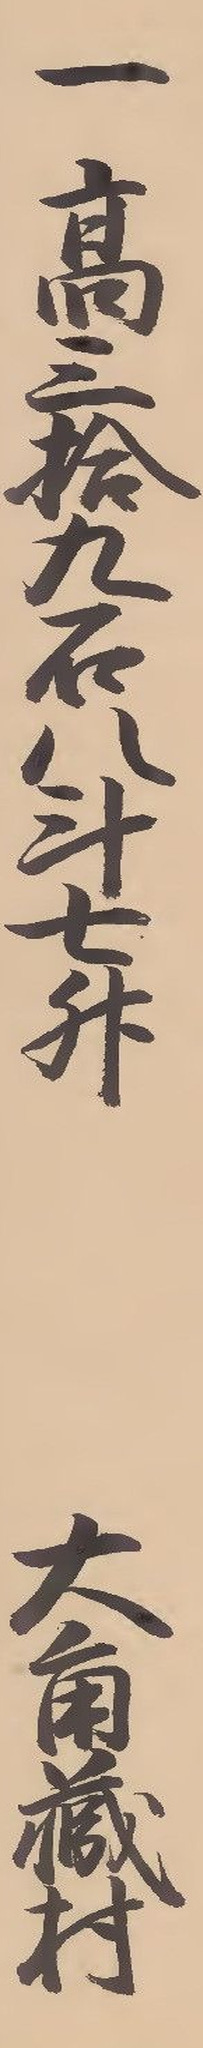一高三拾九石八斗七升大角蔵村
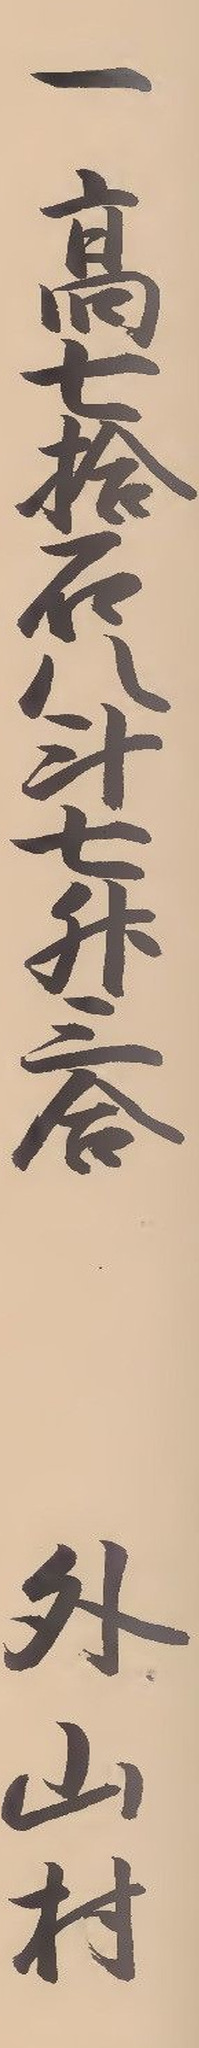一高七拾石八斗七升三合外山村
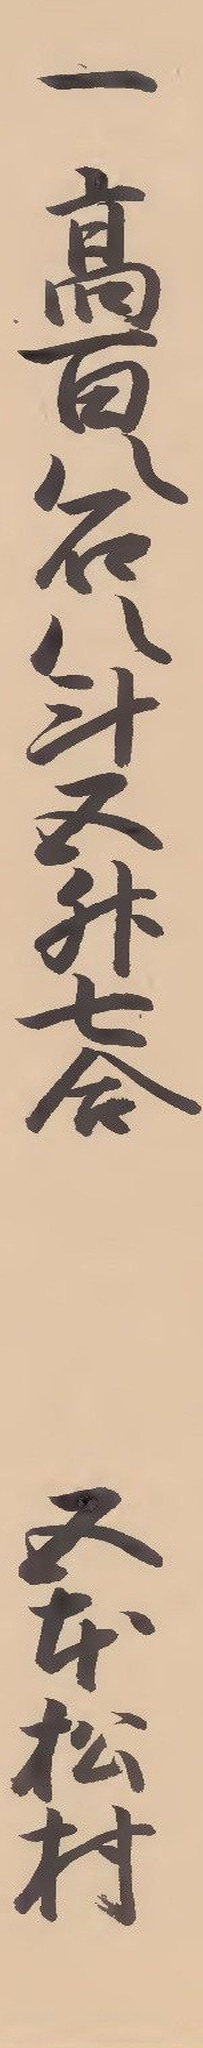一高百八石八斗五升七合五本松村
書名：伊予国郷帳
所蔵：国立公文書館 National Archives of Japan
